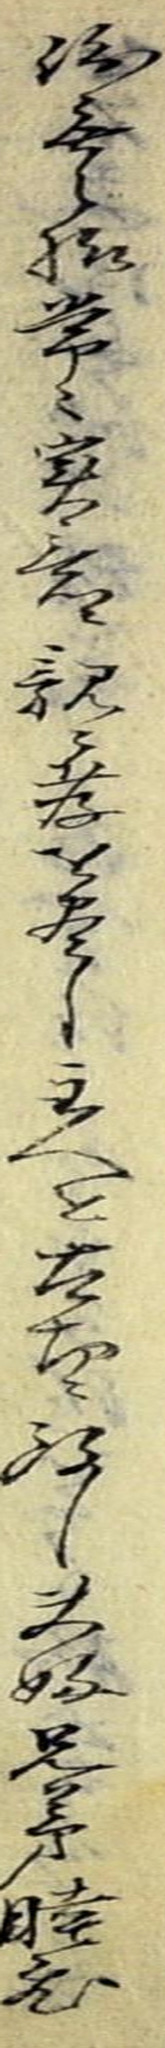儀無之様常々実意に親に孝を尽し主人を太切に致し夫婦兄弟睦敷
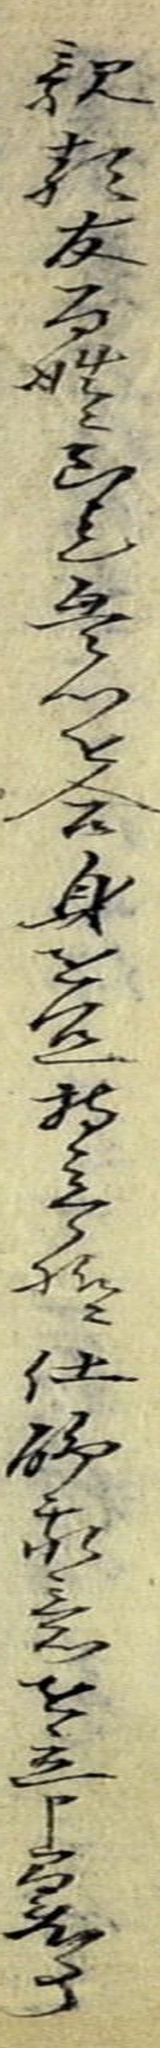親類友百姓に至迄互に心を合身を宜持立候様に仕聊我意を立申間敷事
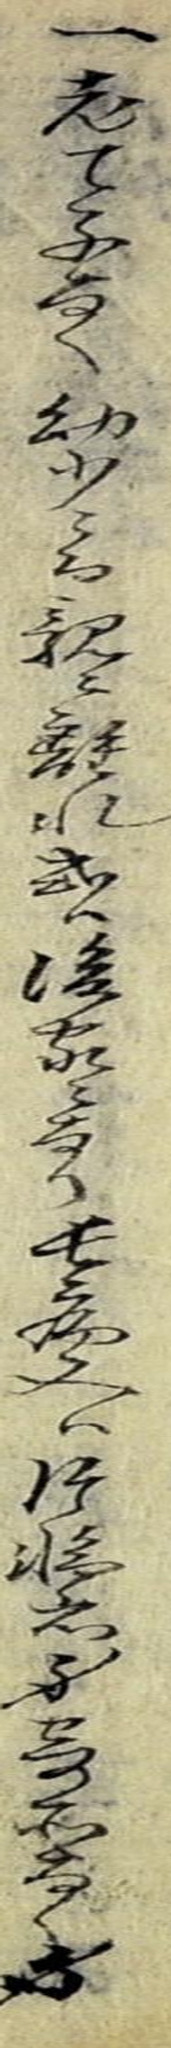一志て子なく幼少に而親に離れ或は後家になり長病又は片輪者身寄所なく身
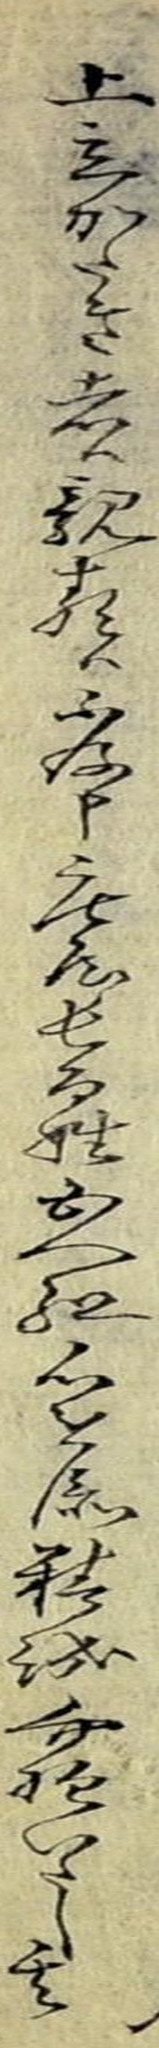上立かたき者は親類は不及申庄屋長百姓五人組心を添精誠介抱いたし其
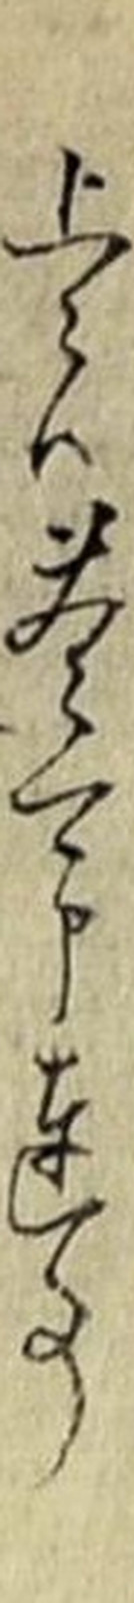上には夫々可申達事
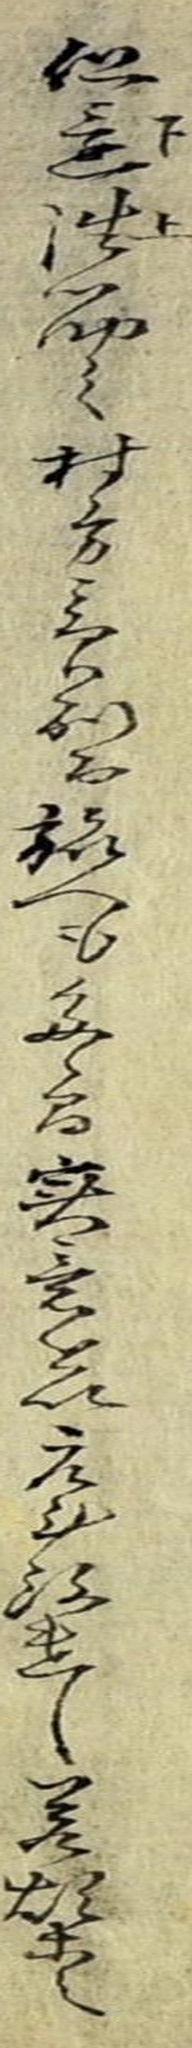但往還筋之村方に而は別而旅人も多候間実意を以取斗致遣し若煩等之
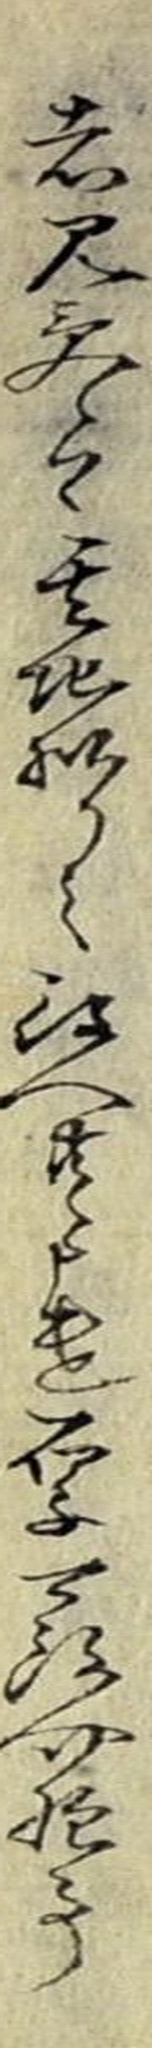者見受候はヽ其地掛り之役人共へ申遣厚可致介抱事
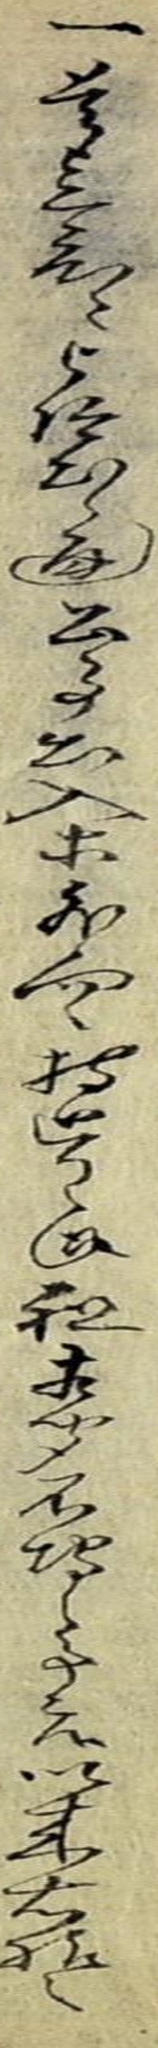一是迄度々被仰出候通公事出入等外向之持廻り之趣粗相聞不埒之事に候以來右様之
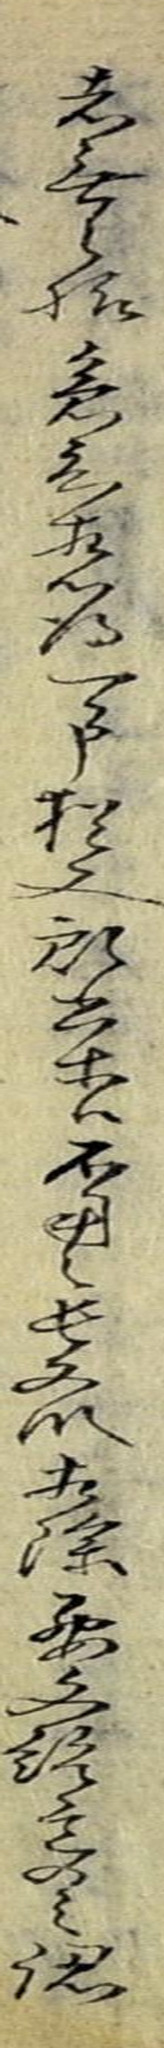者無之様急度相心得可申猶又願書等は不用之長文段相除要文趣意のみ認
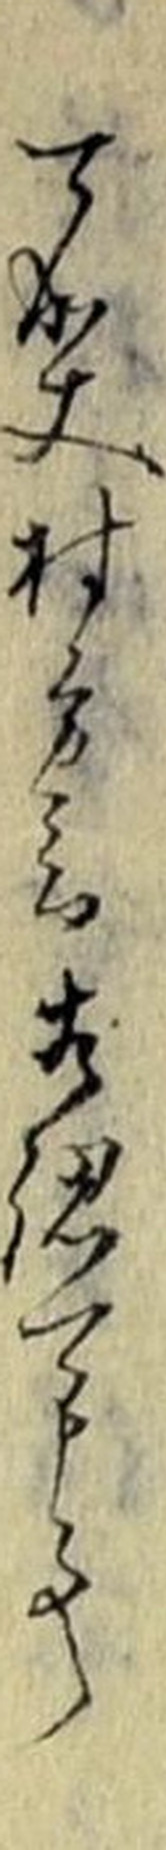可成丈村方に而相認可申事
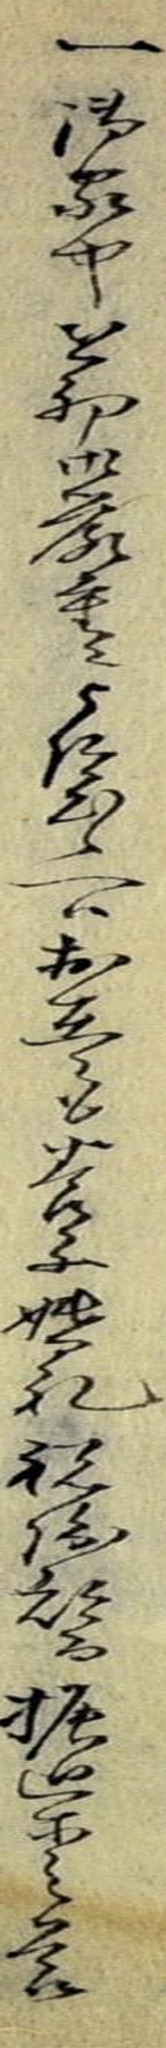一御家中を初御厳重に被仰出候へは於在々も養子婚礼都而振廻等之節
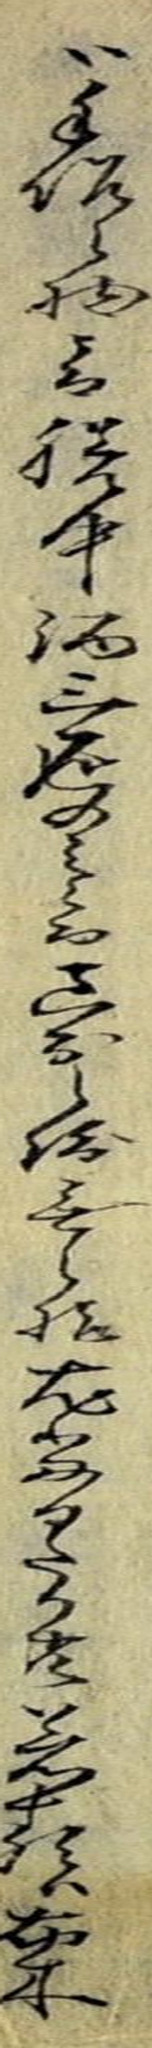は手作之物に而膳中酒三返のみに而過分之儀無之様尤当日たり共着類は布木
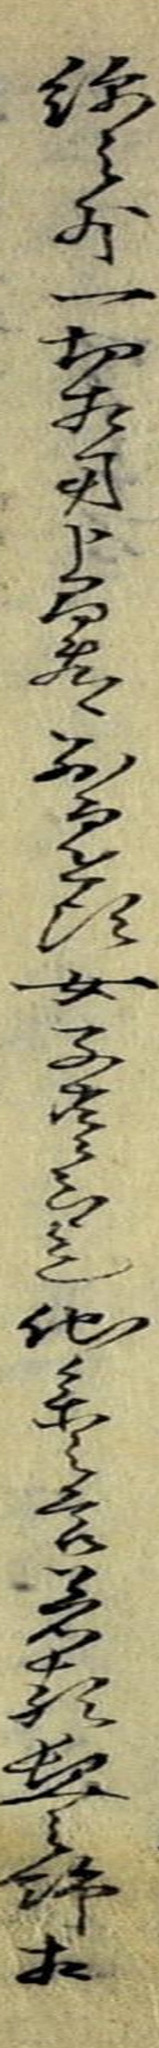綿之外一切相用申間敷候別而近頃女子共に至迄他参之節着類髪之飾相
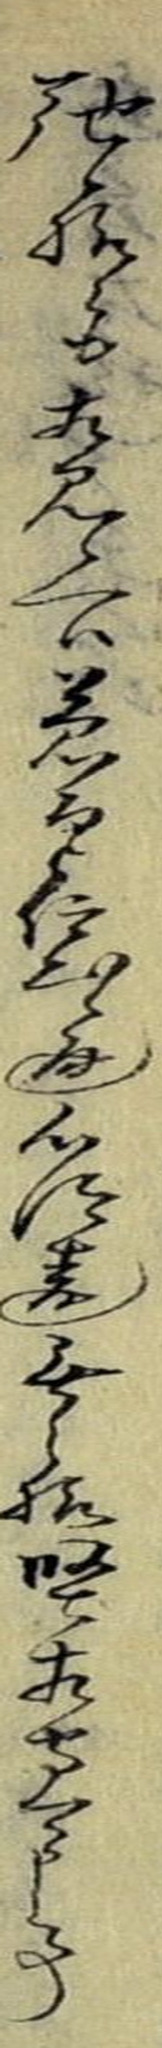弛候様にも相見候へは兼而被仰出候通心得違無之様堅相守可申事
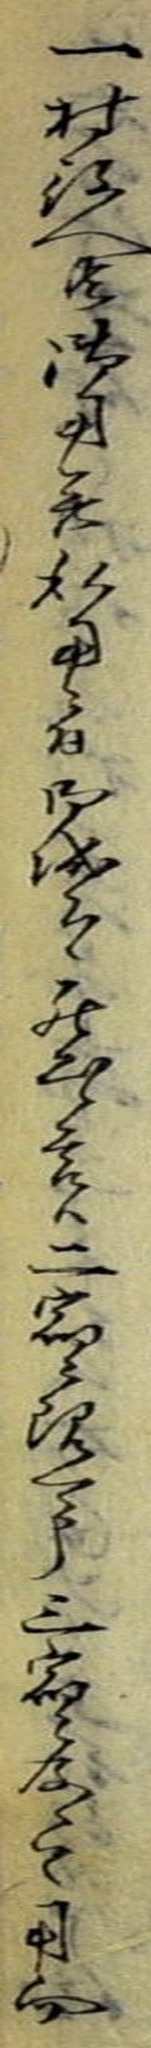一村役人共御用并私用に付御城下へ罷出候節は二宿に限り可申三宿に及候はヽ用向
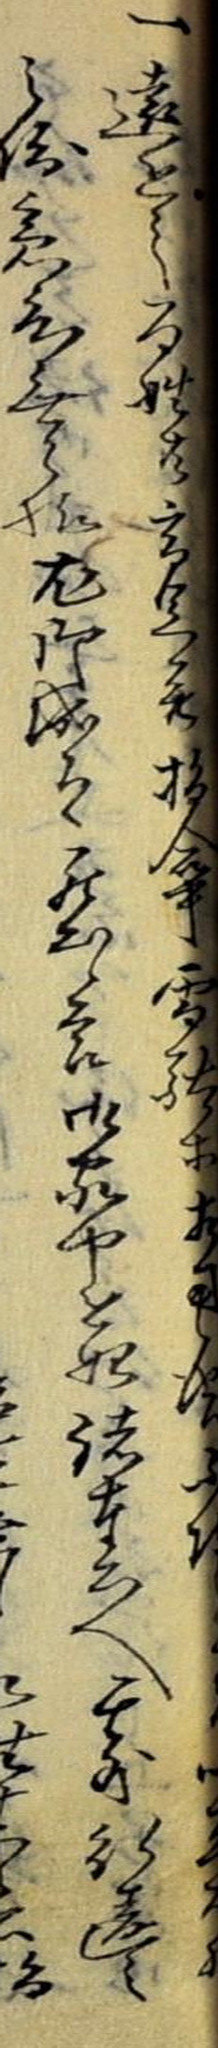之儀急度無之様尤御城下へ罷出候節御家中を始諸奉公人其外行違之
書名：命令之部 六
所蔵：福井県文書館 Fukui Prefectural Archives
